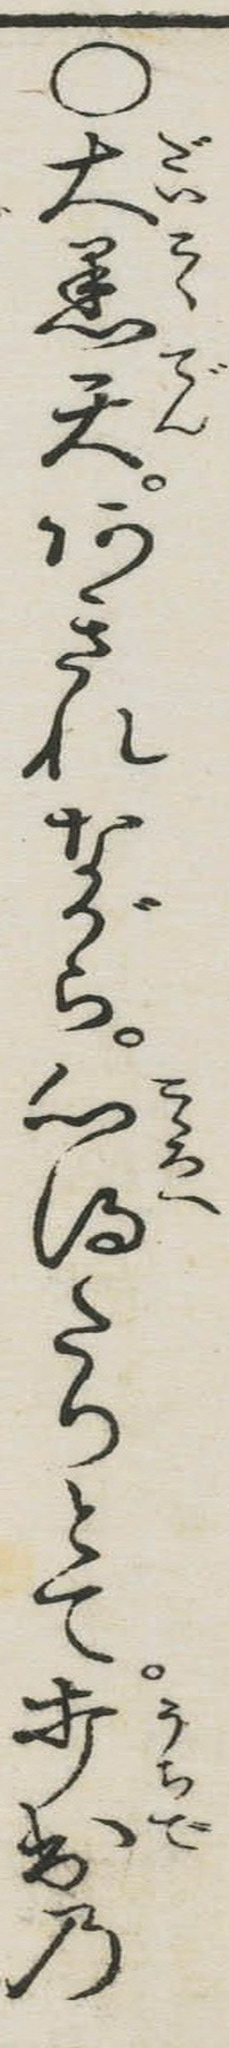○大黒天。あきれながら。心得たりとて。打出の
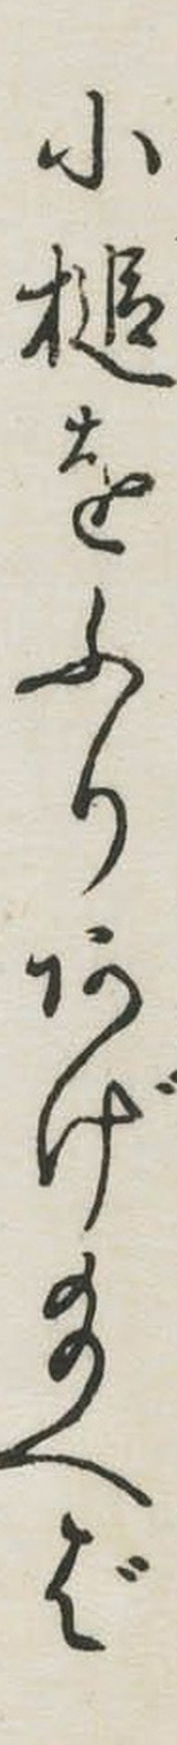小槌をふりあげ給へば
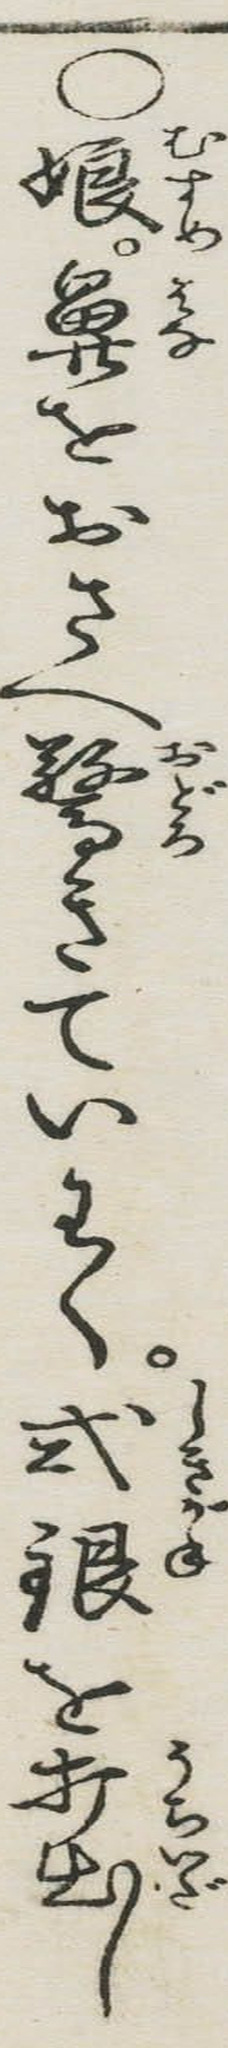○娘。鼻をおさへ驚きていわく。式銀を打出し
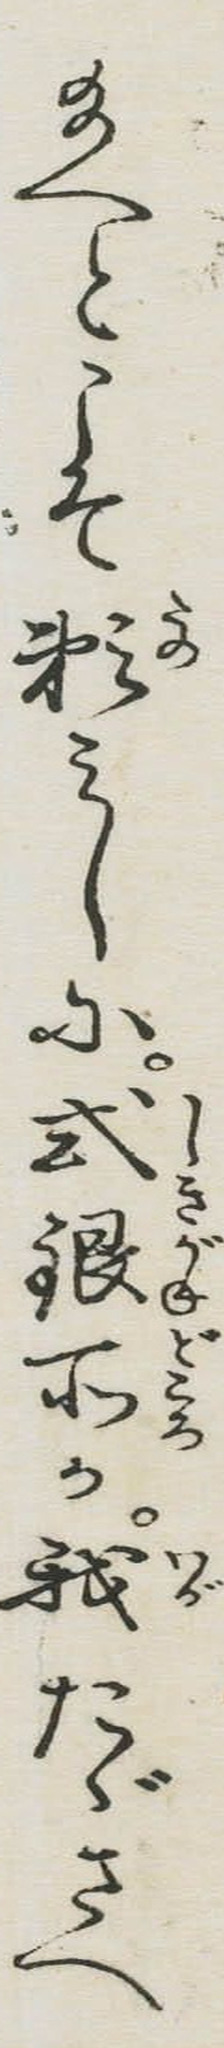給へとこそ頼みしに。式銀所か。我たゞさへ
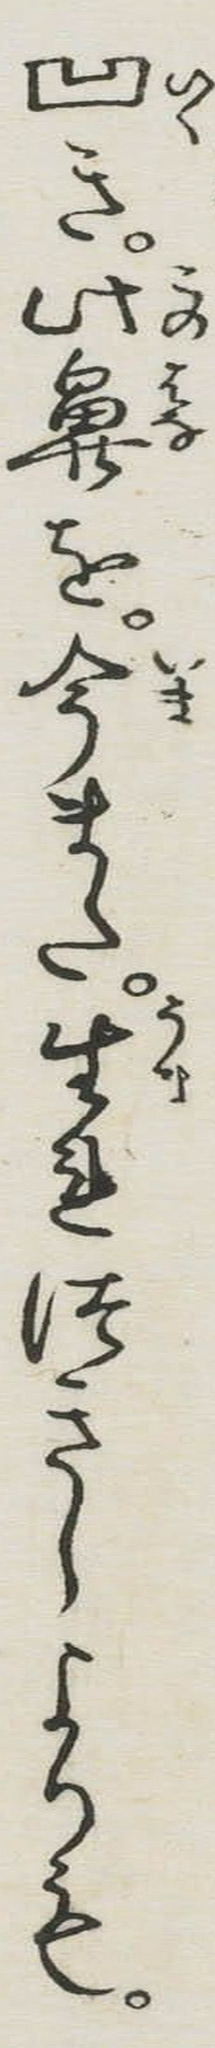凹き。此鼻を。今また。生れつきしよりも。
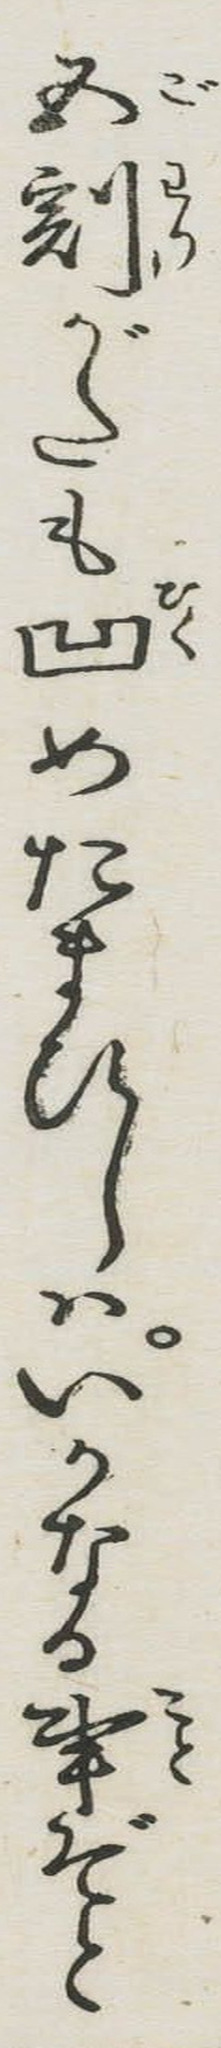五割がたも凹めたまひしは。いかなる事ぞと
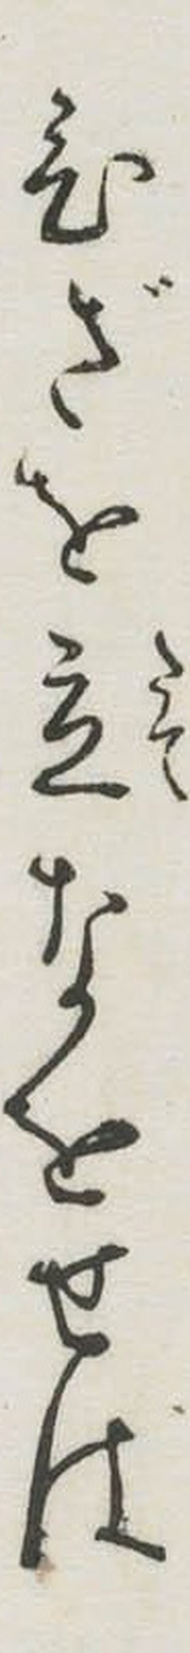ひざを立なをせは
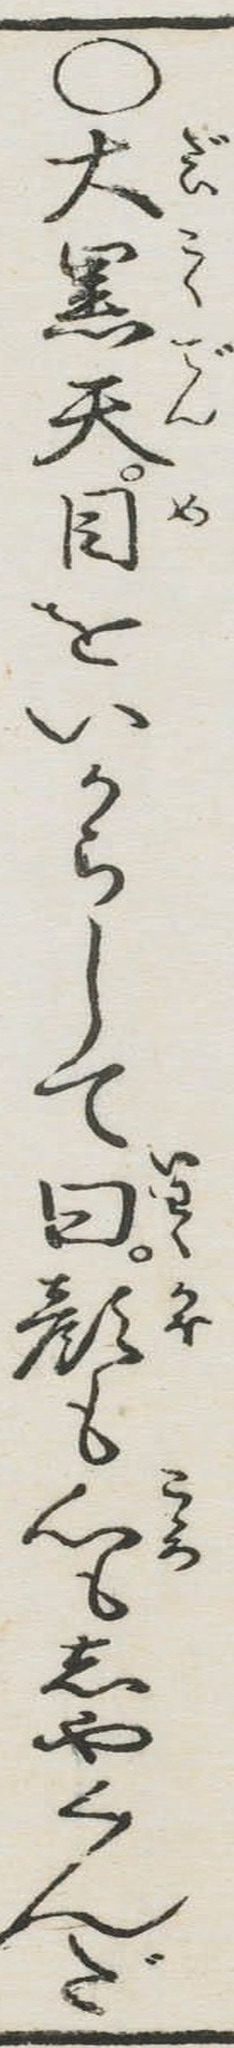○大黒天。目をいからして曰。顔も心もしやくんだ
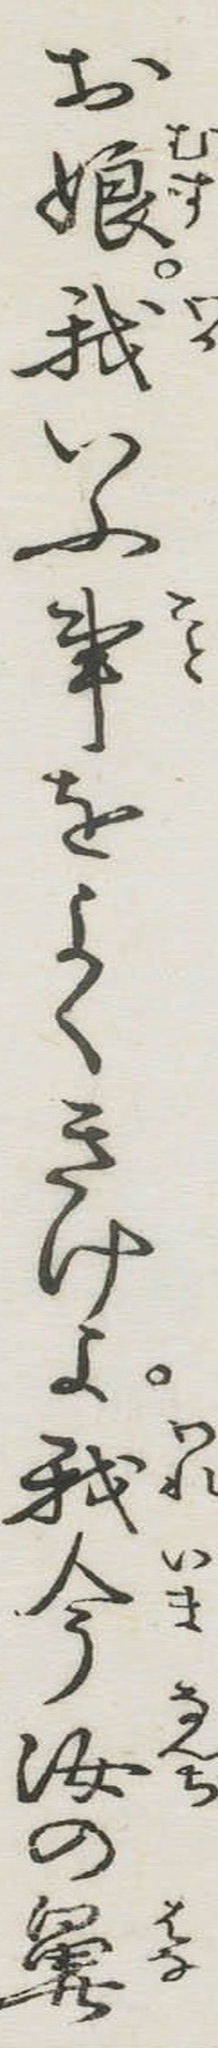お娘。我いふ事をよくきけよ。我今汝の鼻
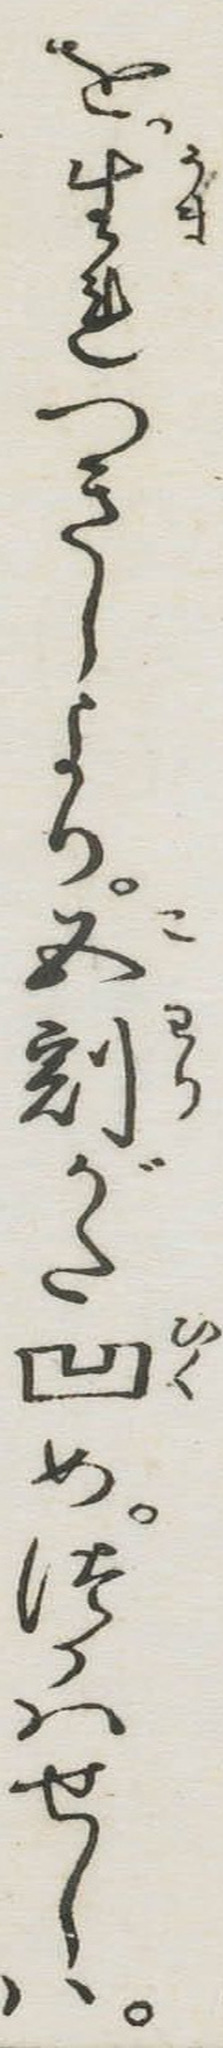を。生れつきしより。五割がた凹め。つかはせしは。
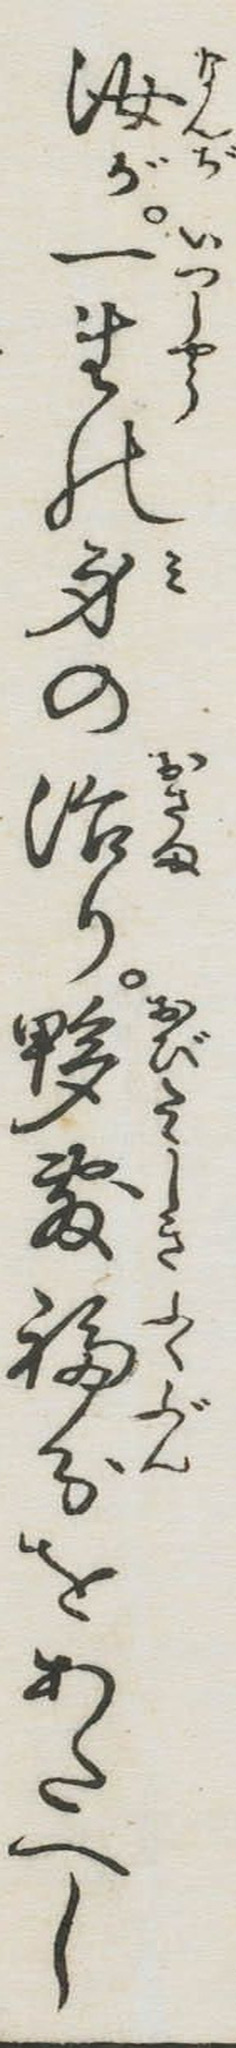汝が。一生の身の治り。夥敷福分をあたへし
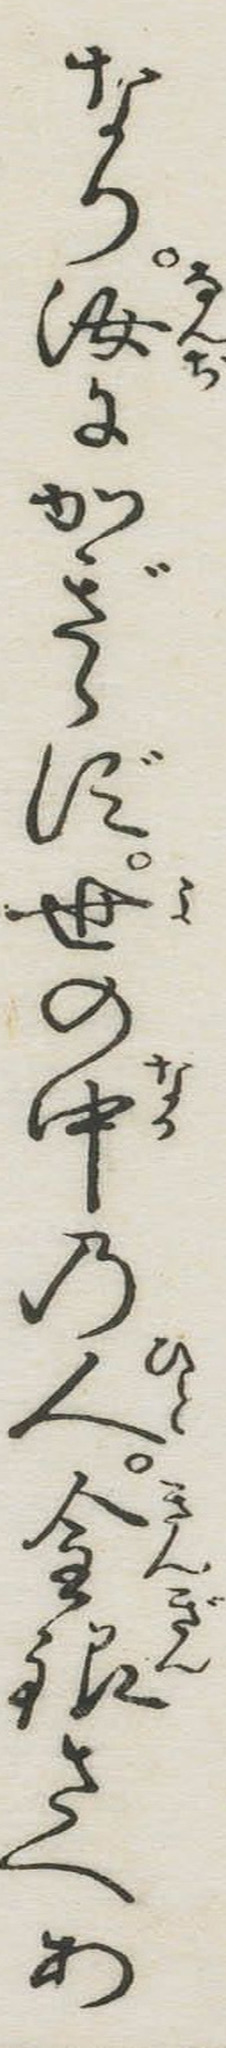なり。汝にかぎらず。世の中の人。金銀さへあ
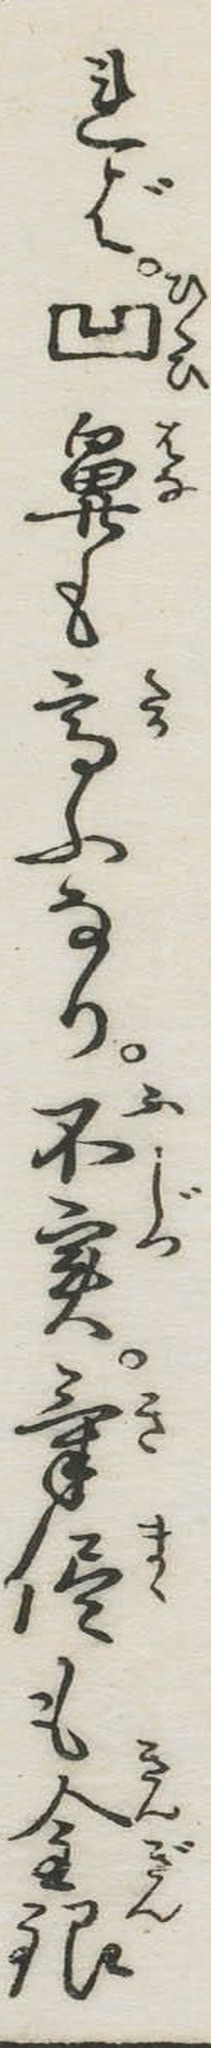れば。凹鼻も高ふなり。不実。気侭も金銀
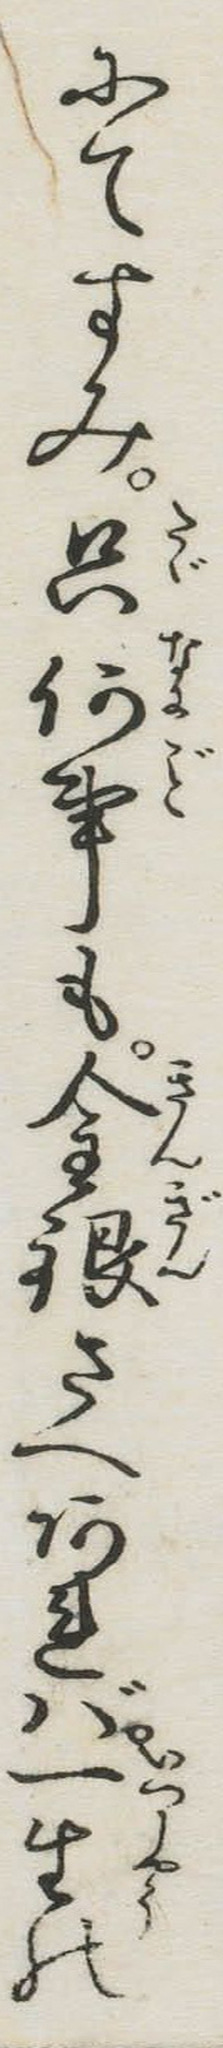にてすみ。只何事も。金銀さへあれば。一生の
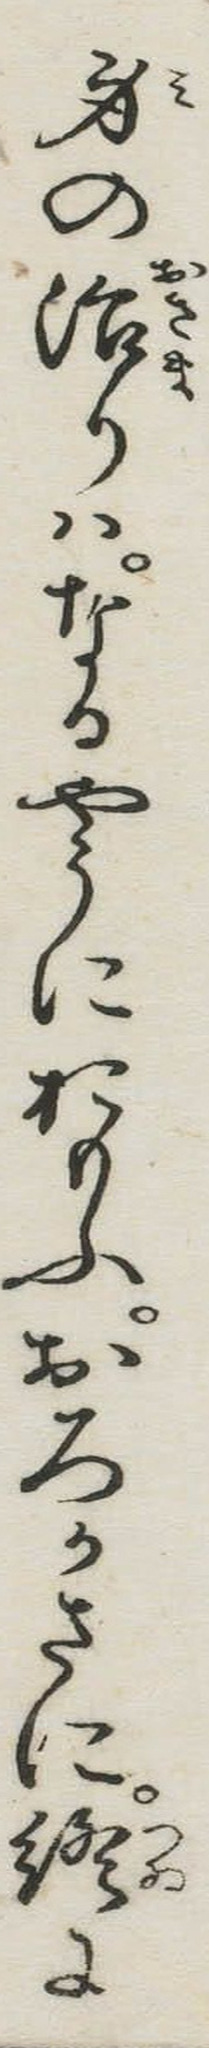身の治りは。なるやうにおもふ。おろかさに。終に
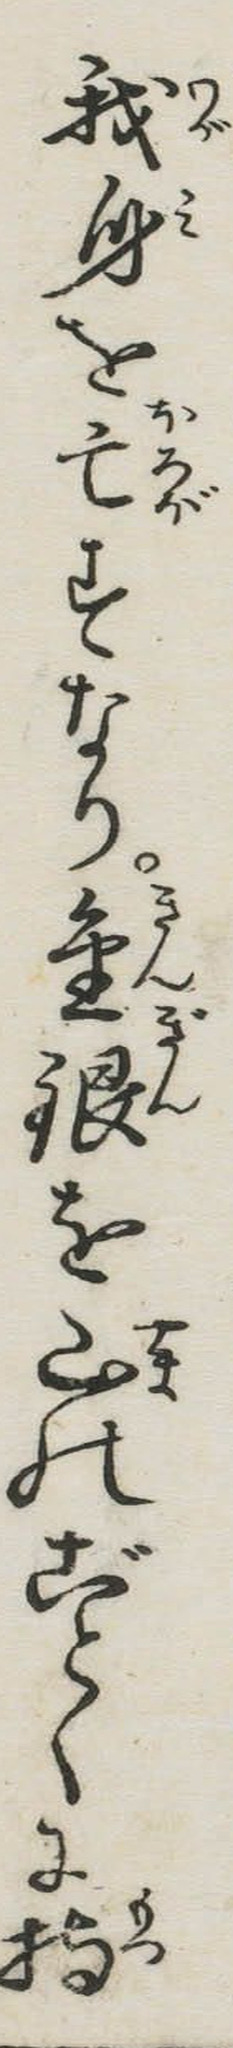我身を亡すなり。金銀を山のごとくに持
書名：福神おしへの小槌 2巻 上
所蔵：東京学芸大学教育コンテンツアーカイブ
